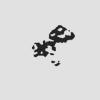墨
